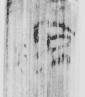安
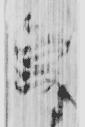事
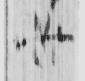必
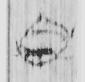自
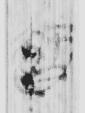智
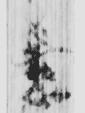之
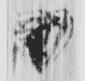則
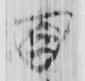百
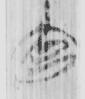官
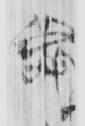敬
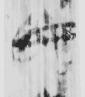母
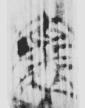褱
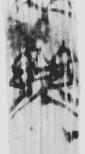樂
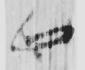㠯（以）
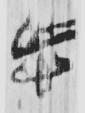忘
